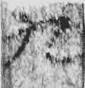九
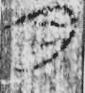月
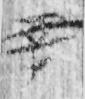辛
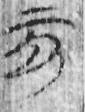亥
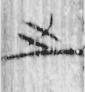之
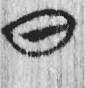日
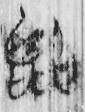臨
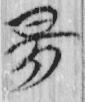昜（陽）
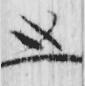之
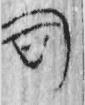司
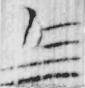馬
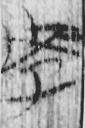李
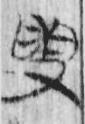受
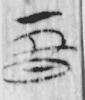○（期）
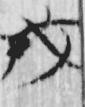戊
